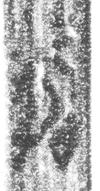器
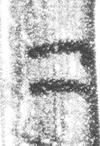二
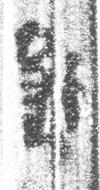○（匕）
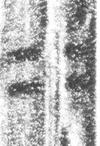二
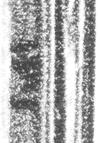○（圓）
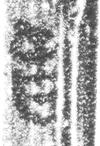缶
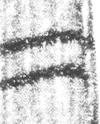二
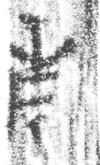青
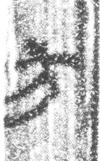方（鈁）
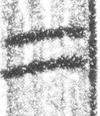二
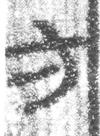方
